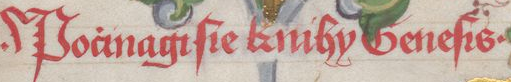Poċinagiſie knihy Geneſis
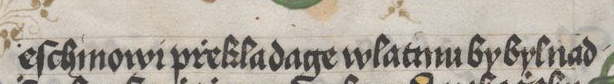eſcginowi pṙekladage wlatinu by bylnad¬
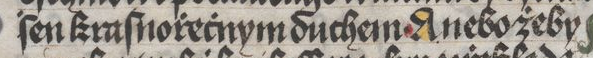ẛen kraſnoṙeċnym duchem.A nebo żeby
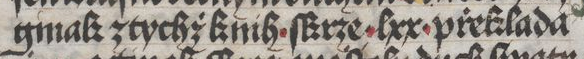ginak z tychż kníh.ſkrze.lxx.pṙeklada¬
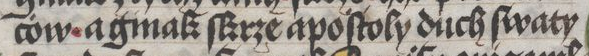ców.a gínak ſkrze apoſtoly duch ſwaty
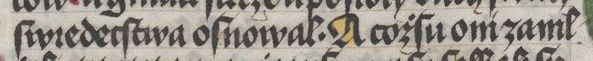ſiviedecſtwa oſnowal.A cożsu o ní zanil¬
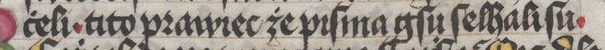ċeli.tito prawiec że piſma gſu ſelhaliſu.
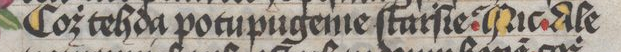Coż tehda potupugenie ſtarẛie?Nic.Ale
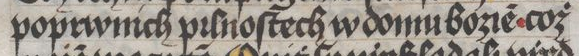poprwních pilnoſtech w domu boziē.coż
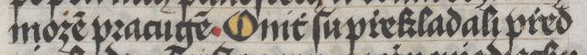możē pracugē.Oniṫ ſu pṙekladali pṙed
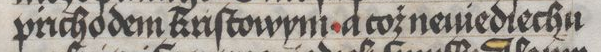pṙichodem kriſtowym.a coż neuiediechu
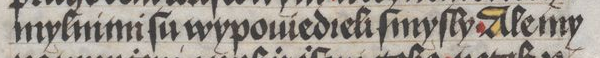mylnimi ſu wypouíedieli ſmyſly.Alemy
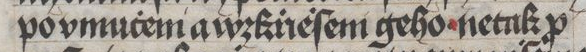po vmuċení a wzkṙieẛení geho.netak ꝓ
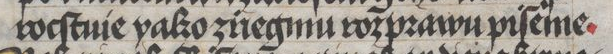rocſtwíe yako zṙiegmu rozprawu piẛeme.
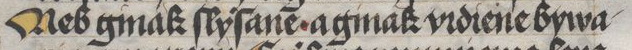Neb ginak ſlyẛane.a gínak vidíene bywa¬
